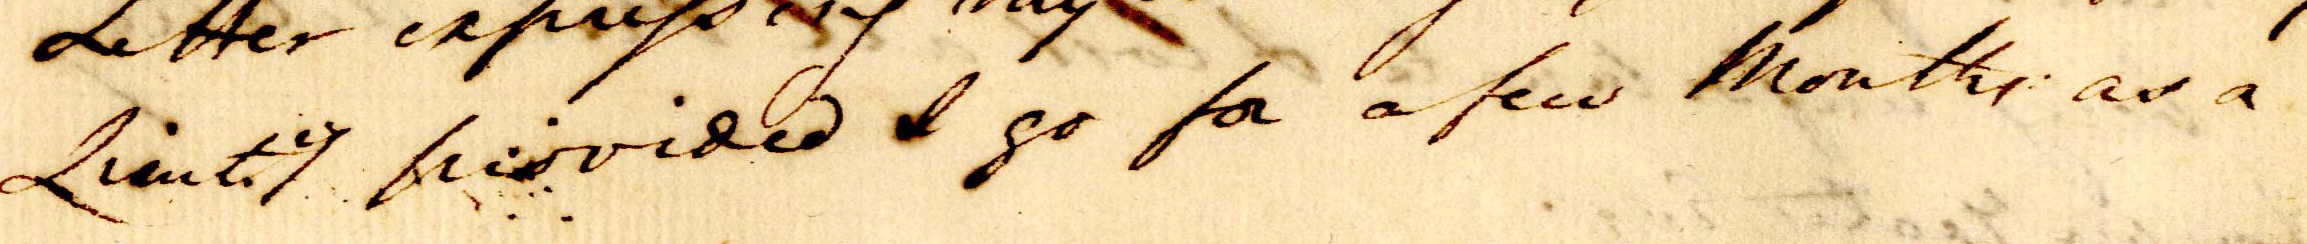Liberty provided I go for a few Months as a
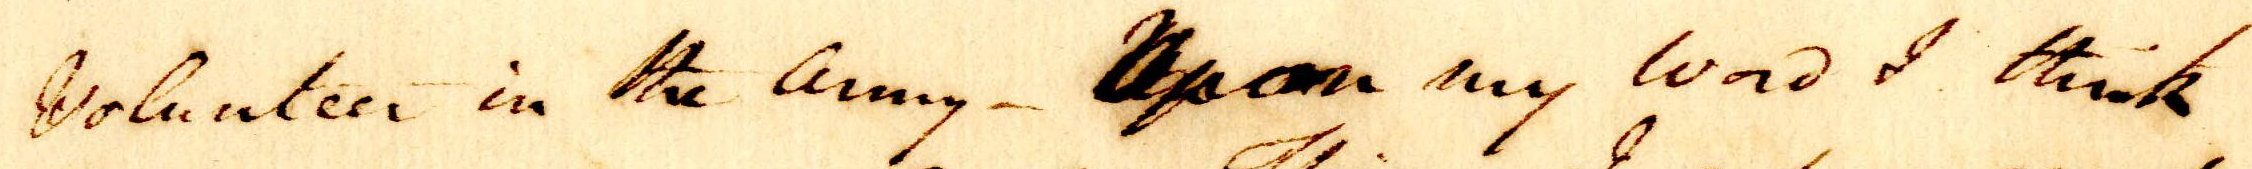Volunteer in the Army. Upon my word I think
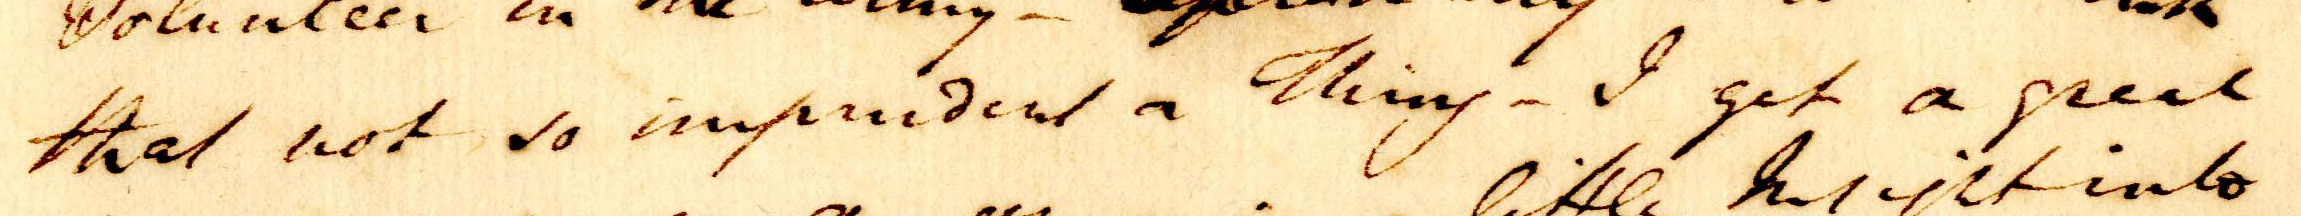that not so imprudent a Thing. I get a great
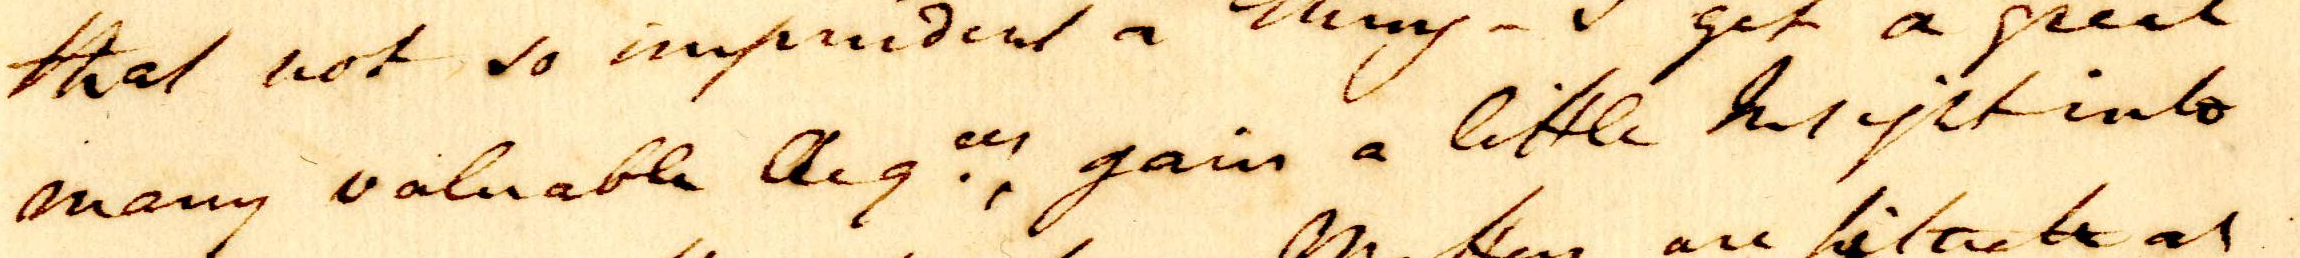enemy valuable Aeg^es. gain a little Insight into
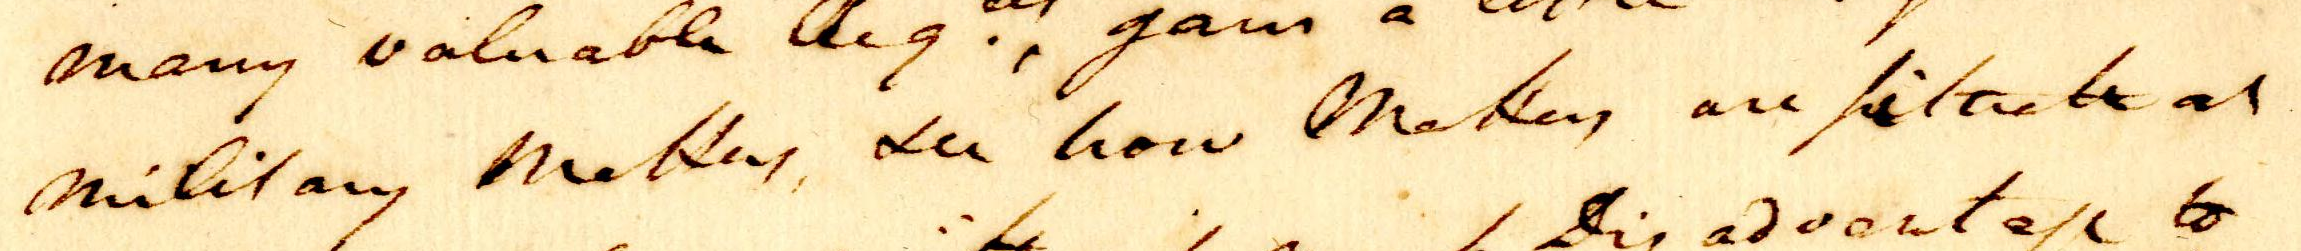military Matters, see how Matters are situate at
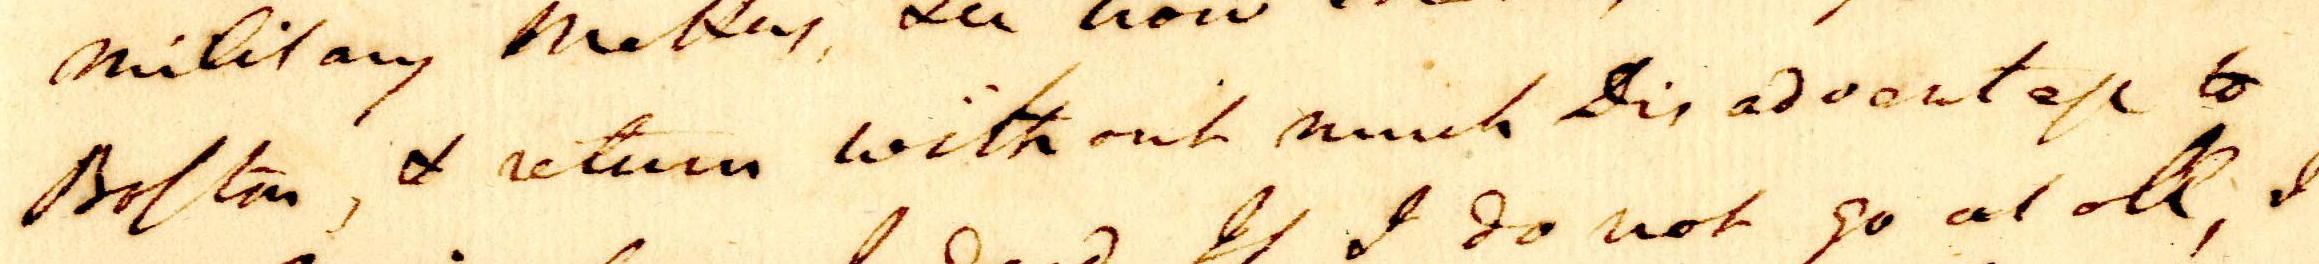Boston, & return without much Disadvantage to
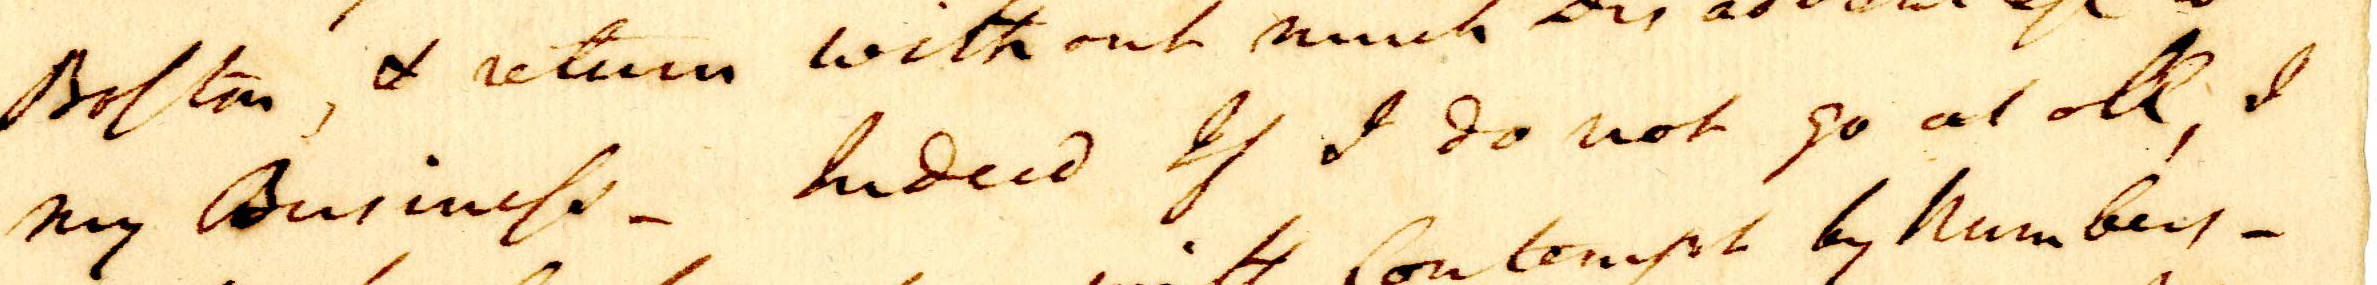my Business. Indeed if I do not go at all, I
